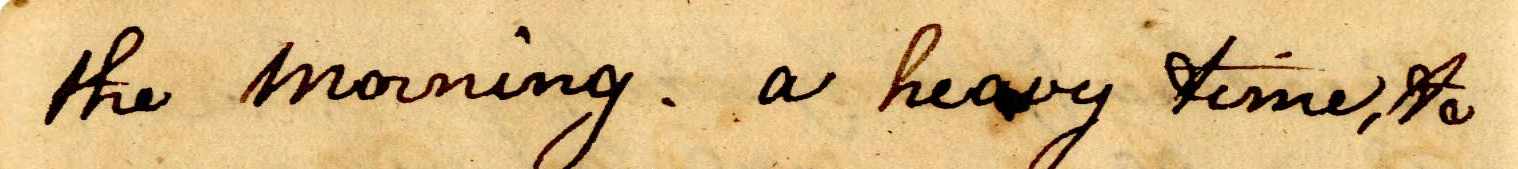the morning. a heavy time, to
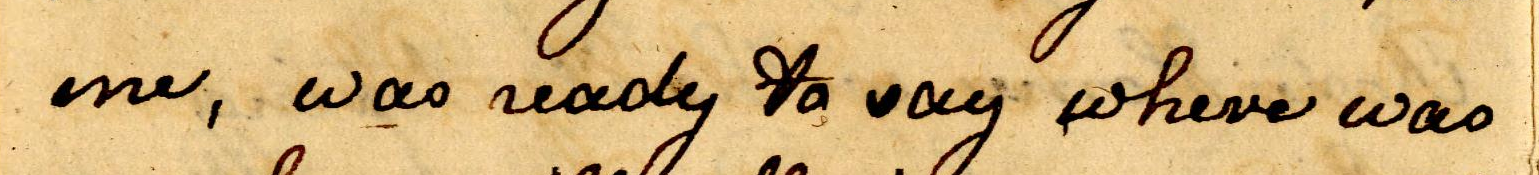me, was ready to say where was
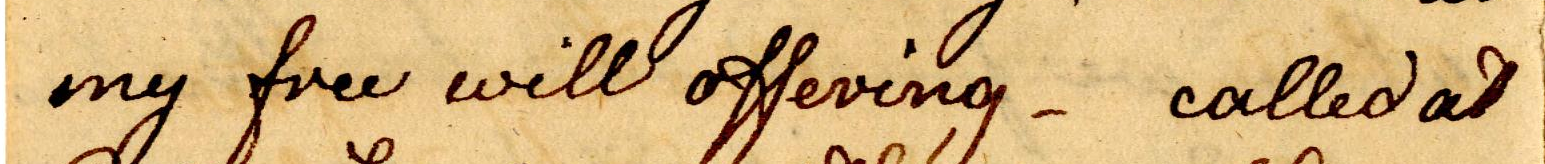my free will offering- called at
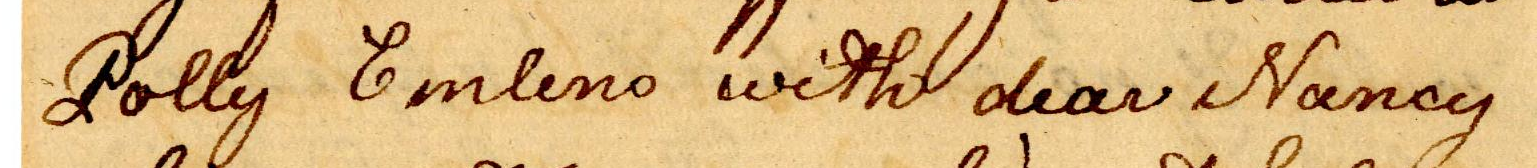Polly Emlens with dear Nancy
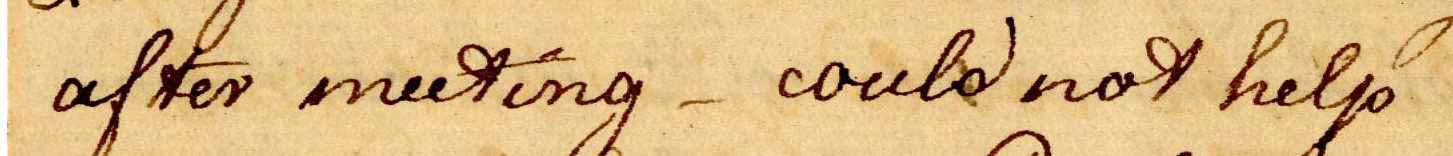after meeting- could not help
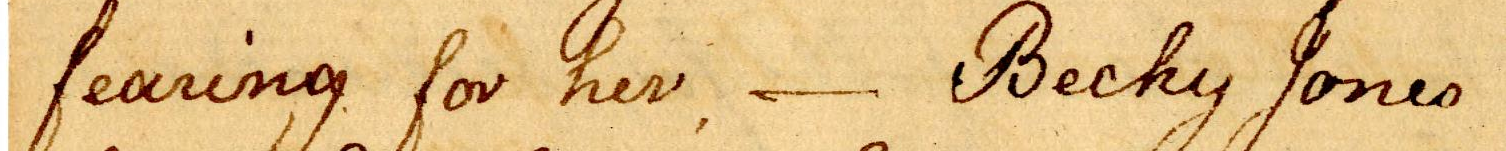fearing for her,- Becky Jones
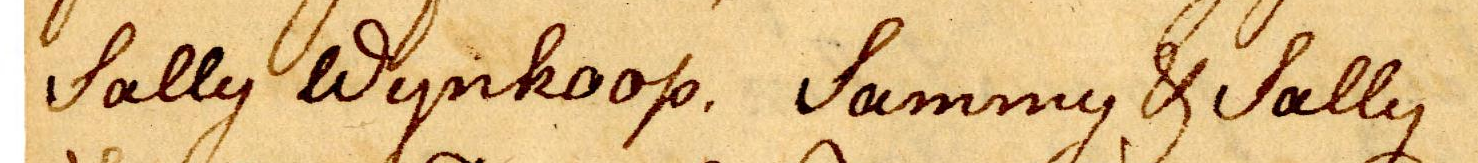Sally Wynkoop, Sammy & Sally
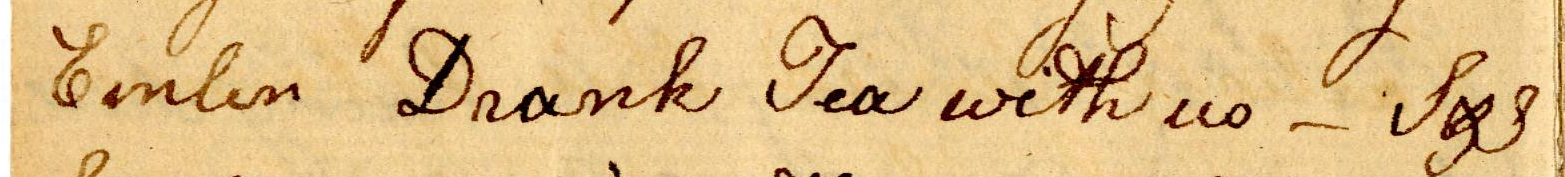Emlen, Drank Tea with us- S&S
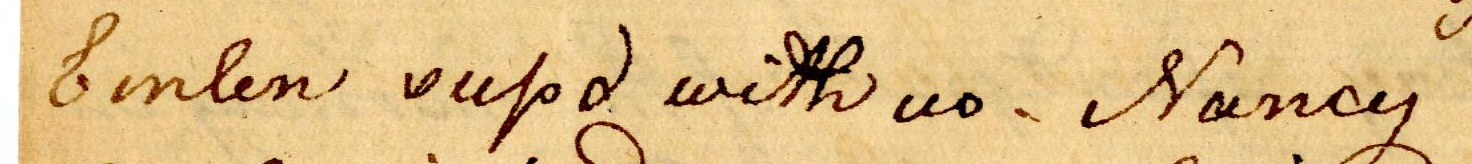Emlen supd with us- Nancy
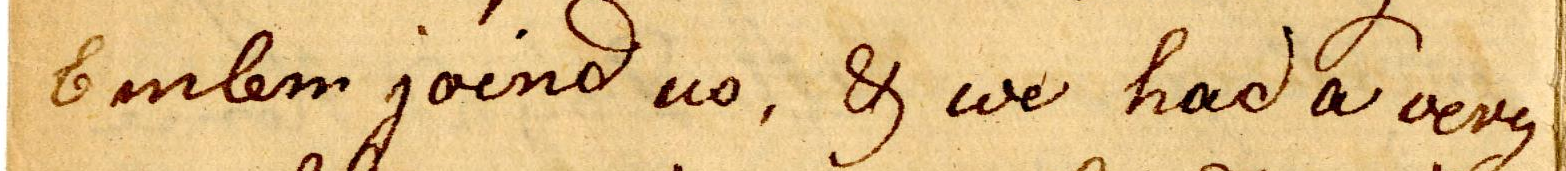Emlem goind us, & we had a very
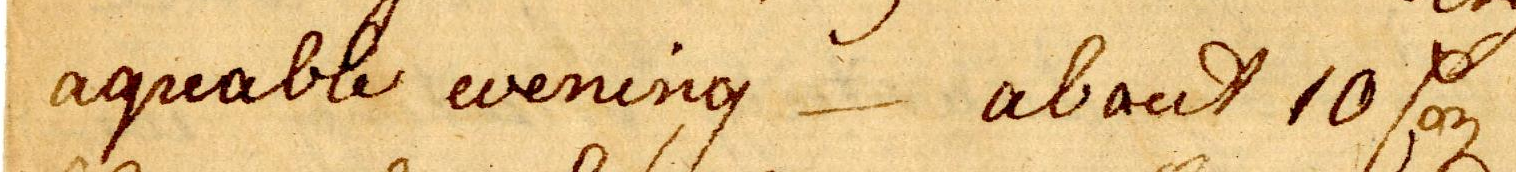agreable evening- about 10 Coz
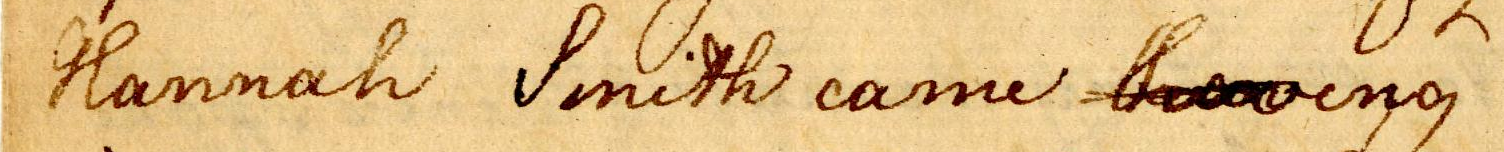Hannah Smith came [hav]ing
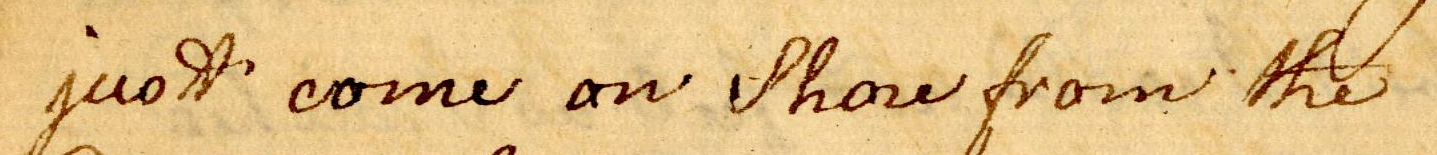just come on Shore from the
